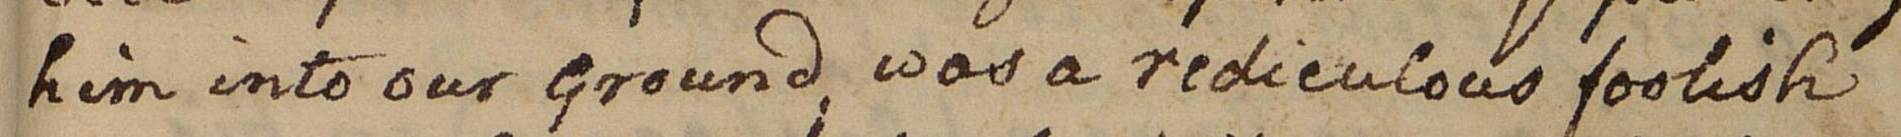him into our Ground was a rediculous foolish
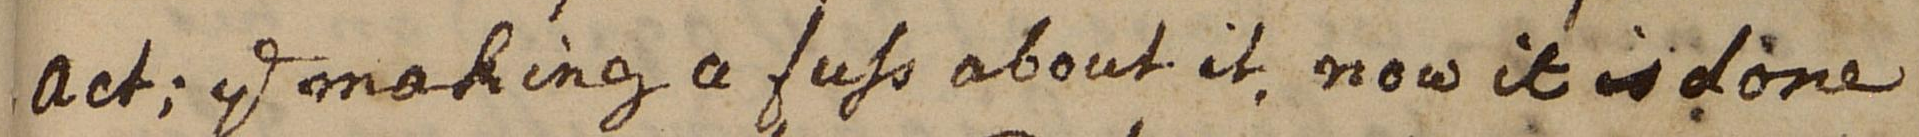Act; y^e making a fuss about it, now it is done
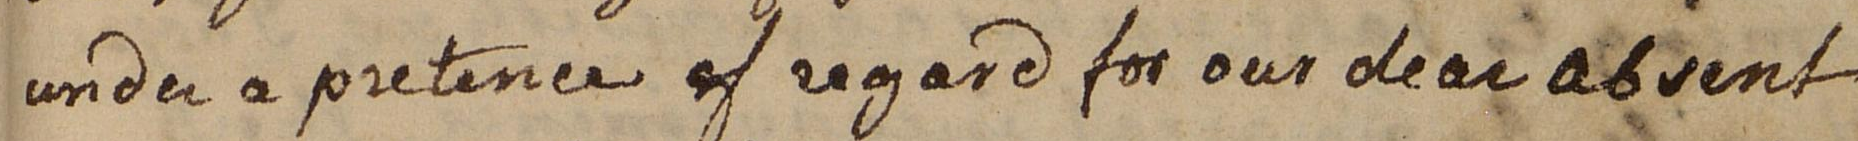under a pretence of regard for our dear absent
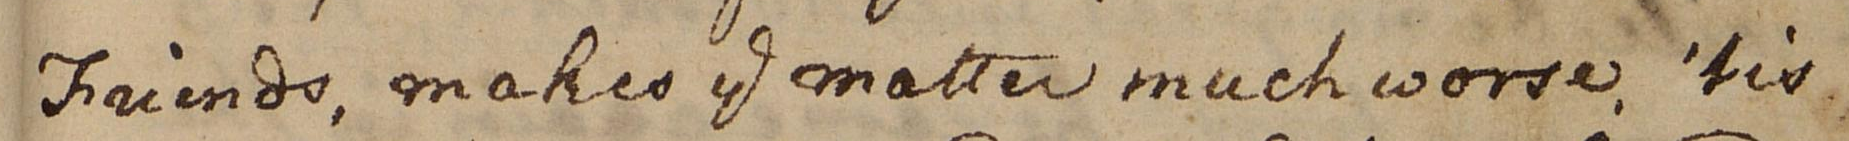Friends, makes y^e matter much worse, 'tis
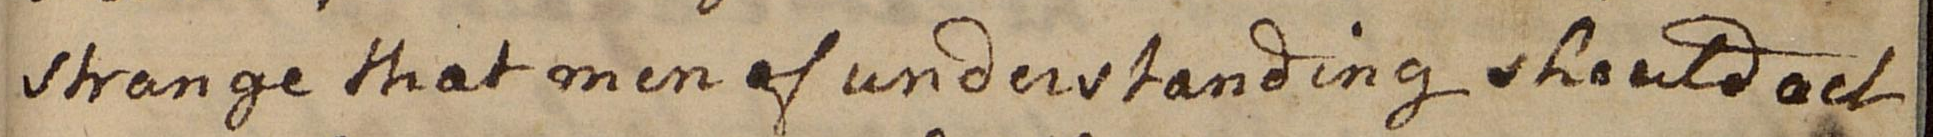strange that men of understanding should act
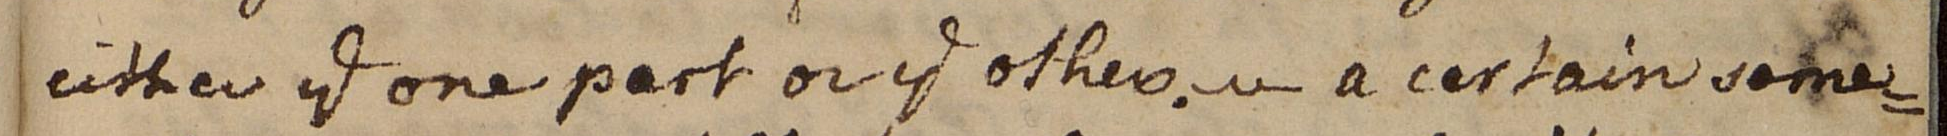either y^e one part or y^e other,- a certain some-
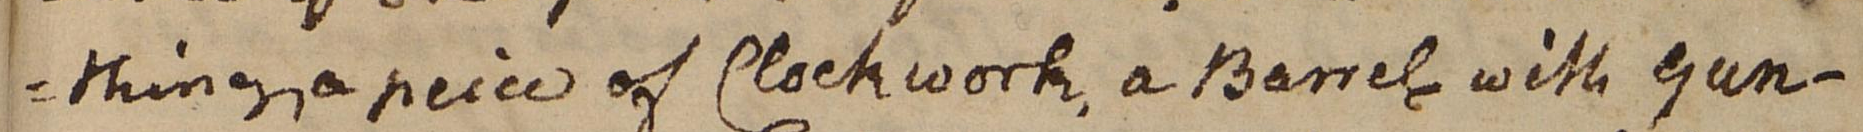-thing a peice of Clockwork, a Barrel with Gun-
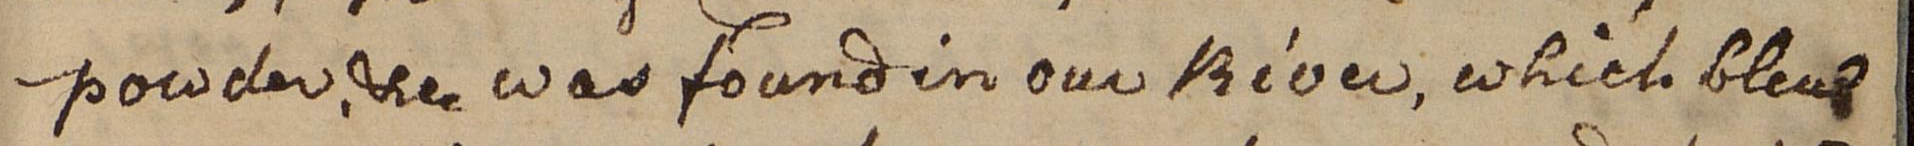-powder, &c was found in our River, which blew
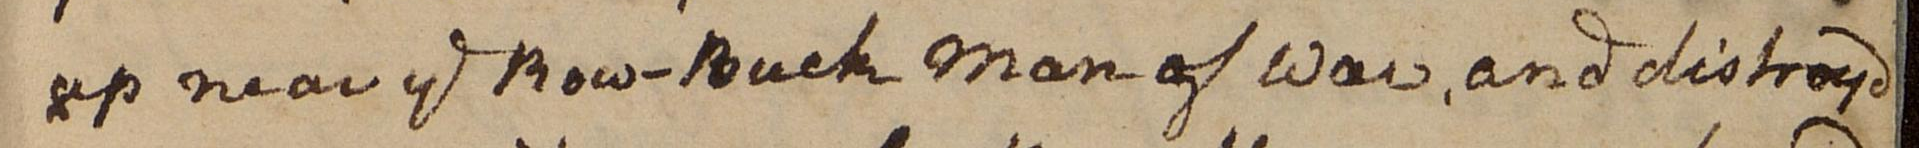up near y^e Row-Buck Man of War, and distroyd
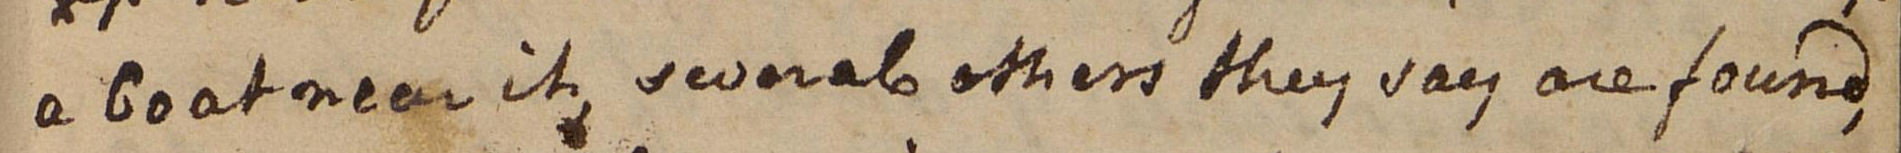a boat near it, several others they say are found,
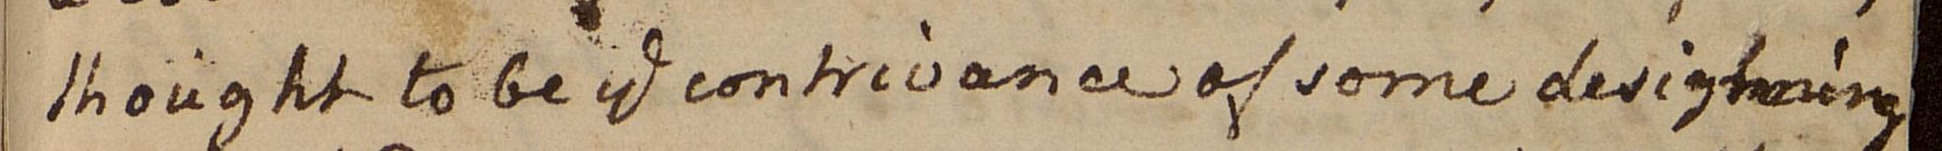thought to be y^e contrivance of some desigtning
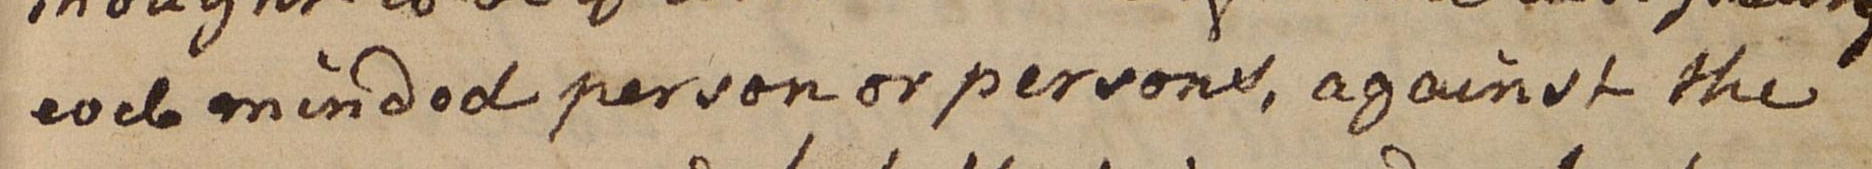evil minded person or persons, against the
